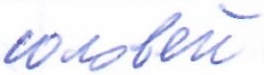соловей
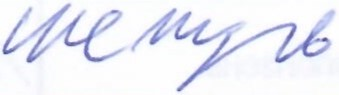снегирь
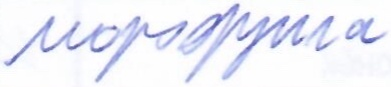мородунга
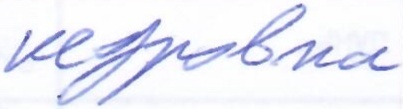кедровка
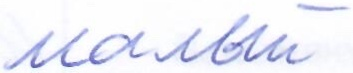малый
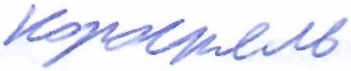коростель
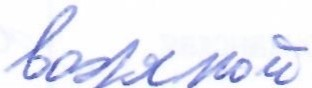водяной
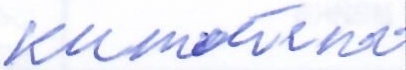китойспя
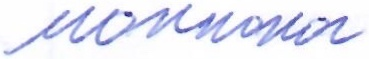мохноног
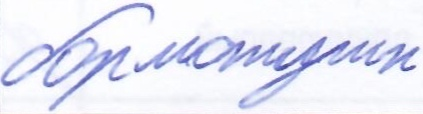бормотушк
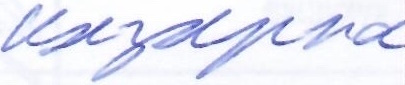казарга
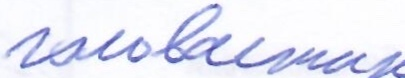головастик
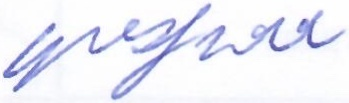средгяя
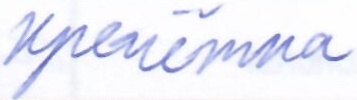кречётка
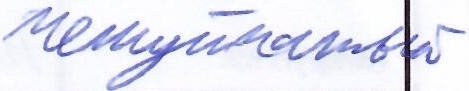чешуйчатый
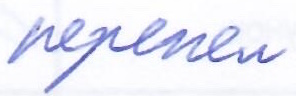перепел
